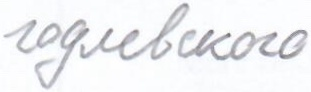годлевского
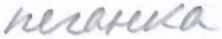пеганка
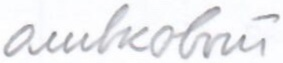оливковый
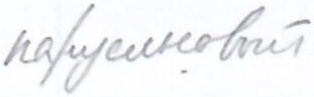парусиновый
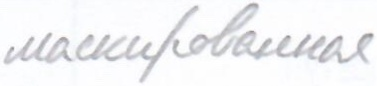маскированная
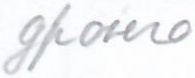дронго
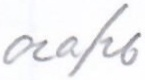огарь
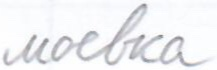моевка
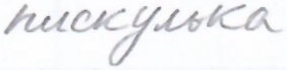пискулька
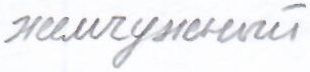жемчужный
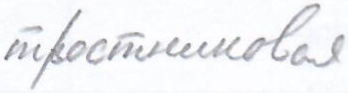тростниковая
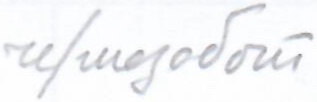чернозобый
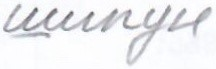шипун
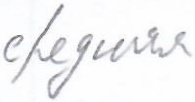средняя
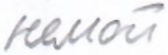немой
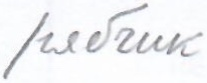рябчик
